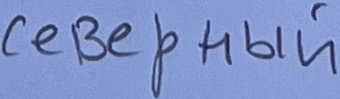северный
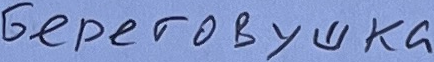береговушка
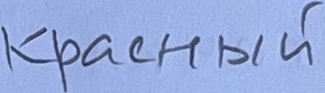красный
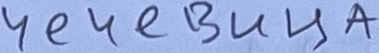чечевица
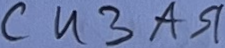сизая
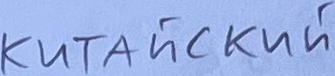китайский
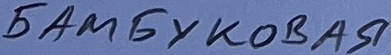бамбуковая
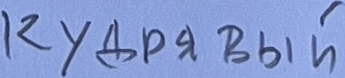кудрявый
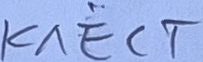клёст
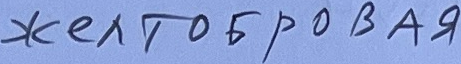желтобровая
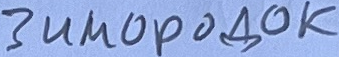зимородок
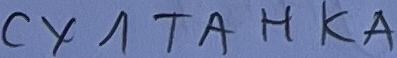султанка
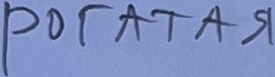рогатая
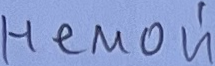немой
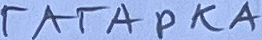гагарка
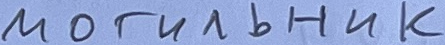могильник
